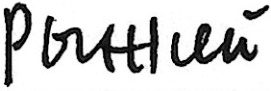рыжий
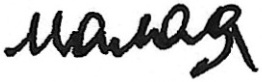малая
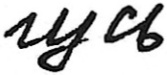гусь
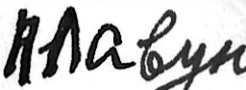плавун
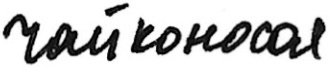чайконосая
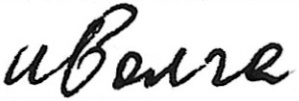иволга
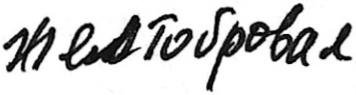желтобровая
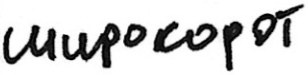широкорот
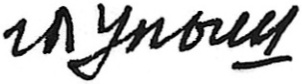глупыш
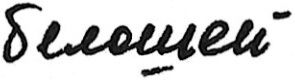белошей
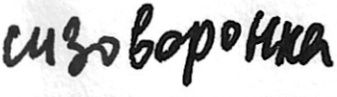сизоворонка
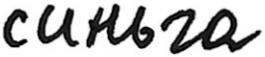синьга
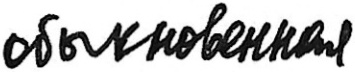обыкновенная
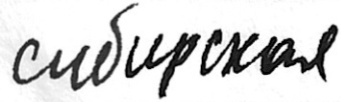сибирская
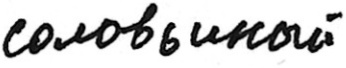соловьиный
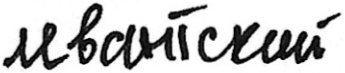левантский
